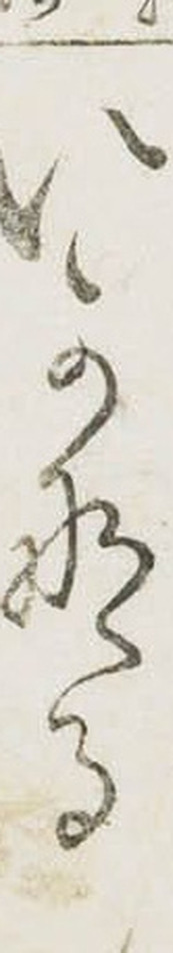いかなる
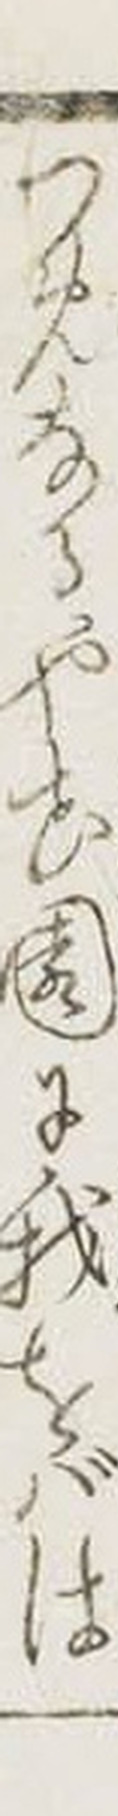つめなるや花園に我をばは
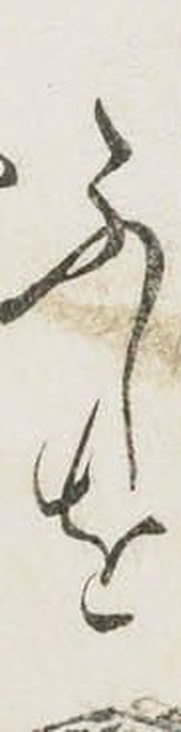ふしを
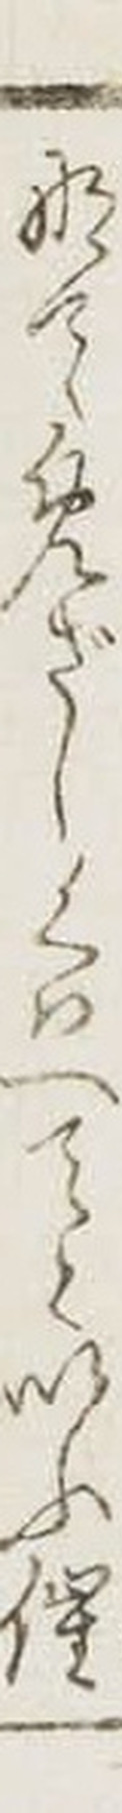なてめざしくはへてといふ催
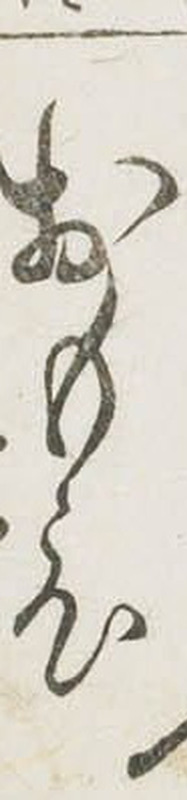おもひ
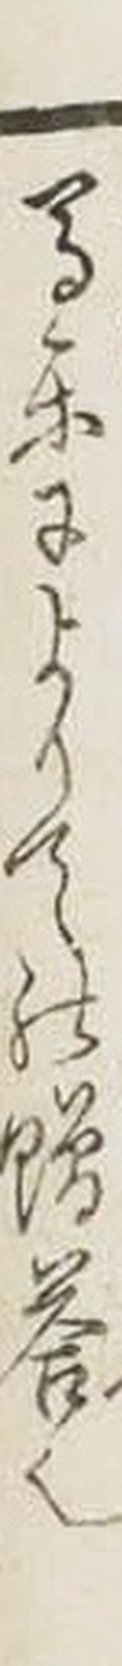馬楽によりての贈答也
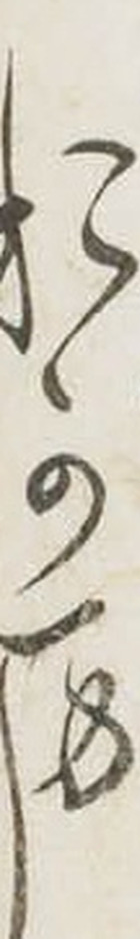おかまし
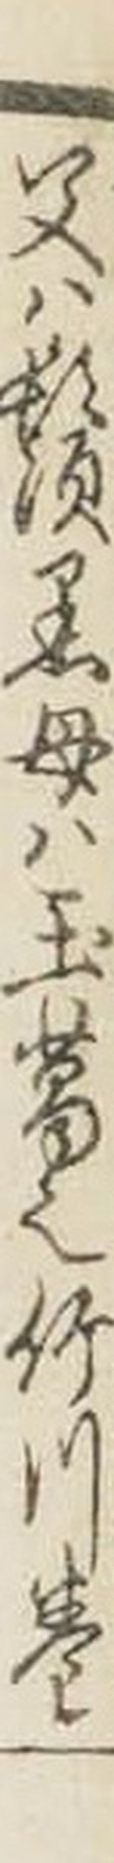父は鬚黒母は玉葛也竹川巻
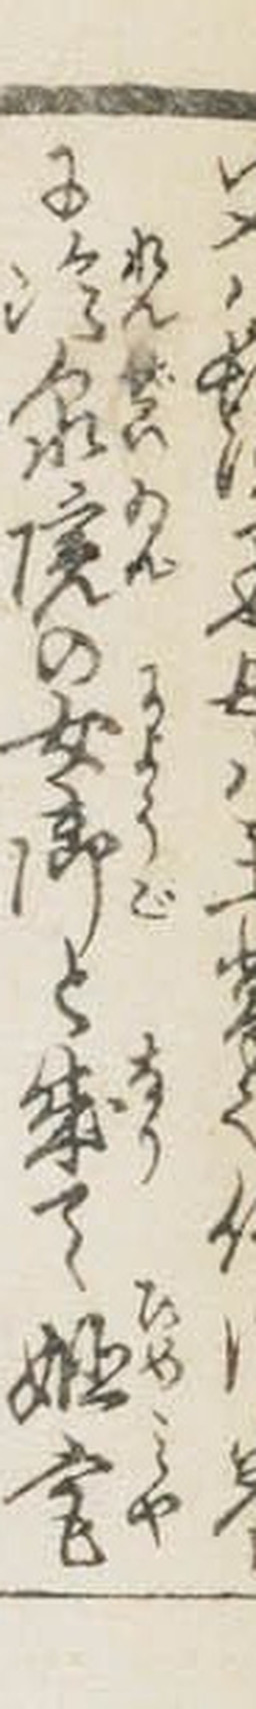に冷泉院の女御と成て姫宮
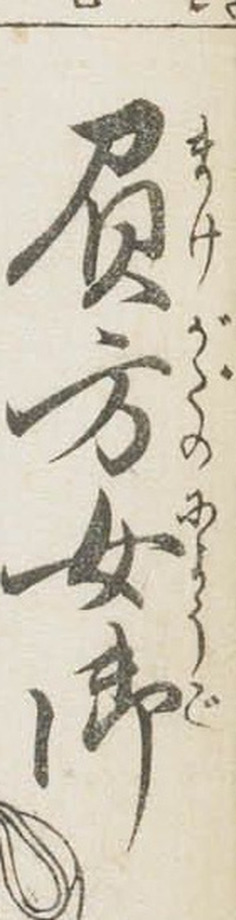負方女御
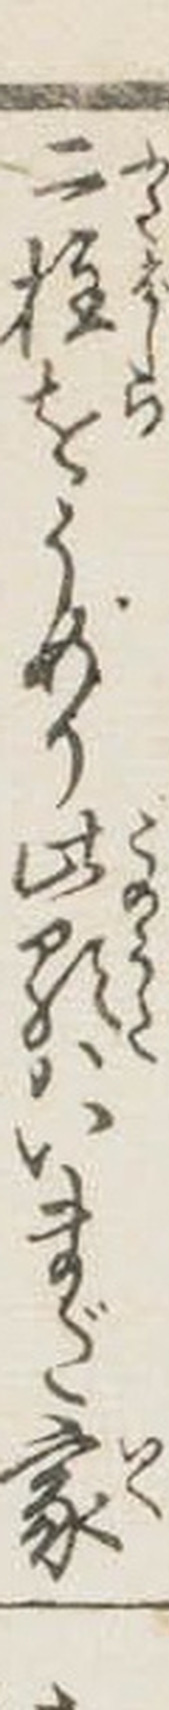二柱をうめり此歌はいまだ家
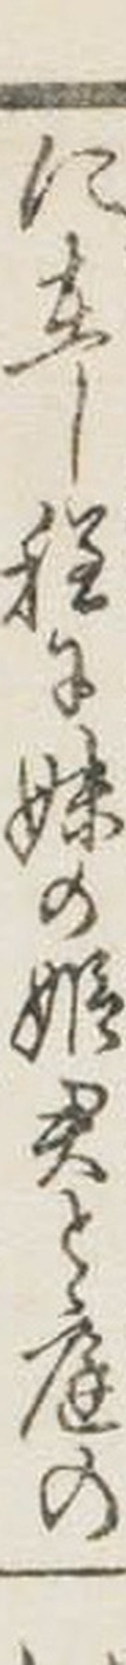に在し程に妹の姫君と庭の
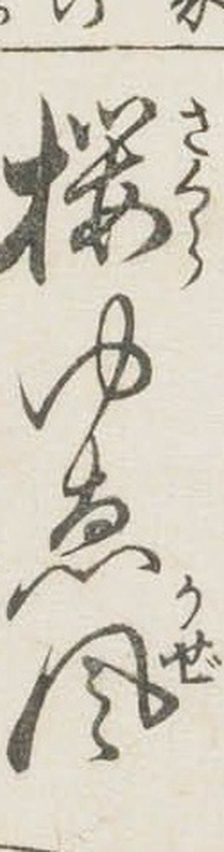桜ゆゑ風
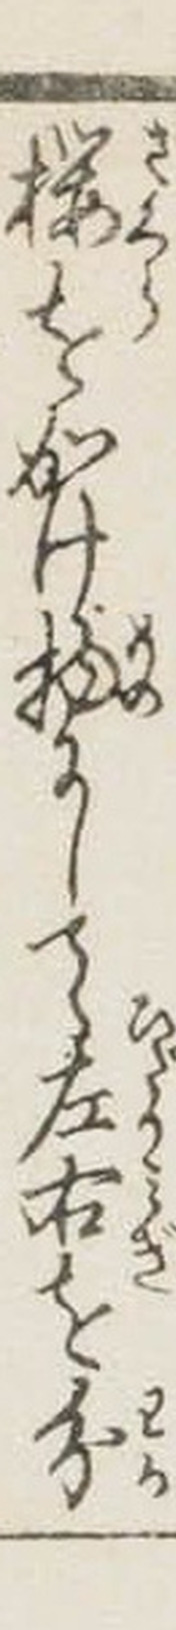桜をかけ物にして左右を分
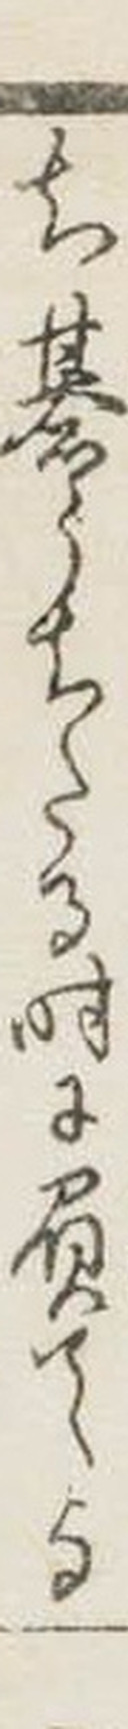ち碁うちたる時に負てよ
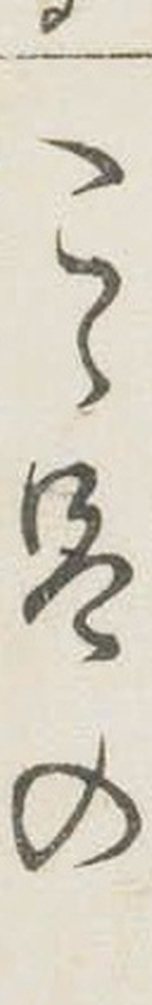こゝろの
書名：源氏百人一首
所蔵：東京学芸大学教育コンテンツアーカイブ
